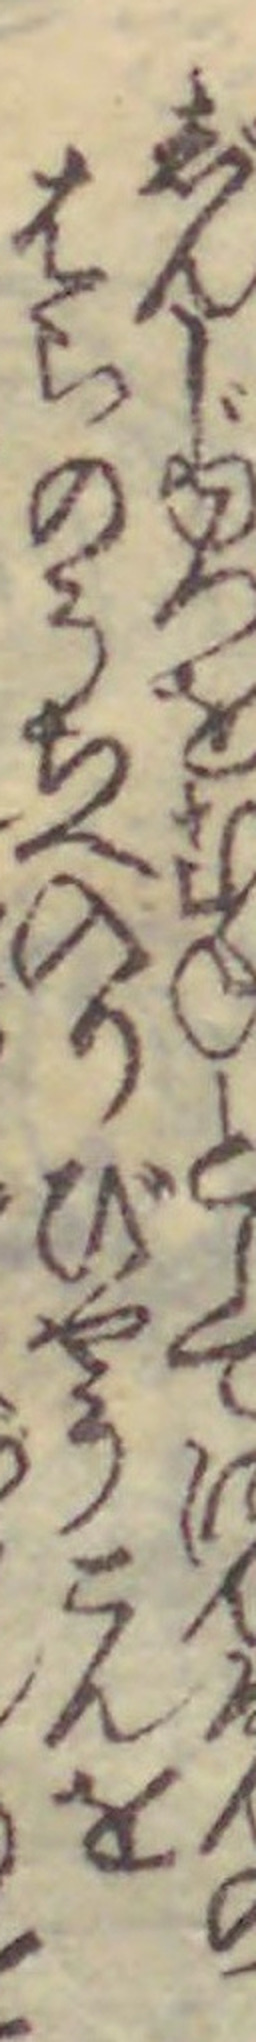はらのうちへ入りびやうこんを
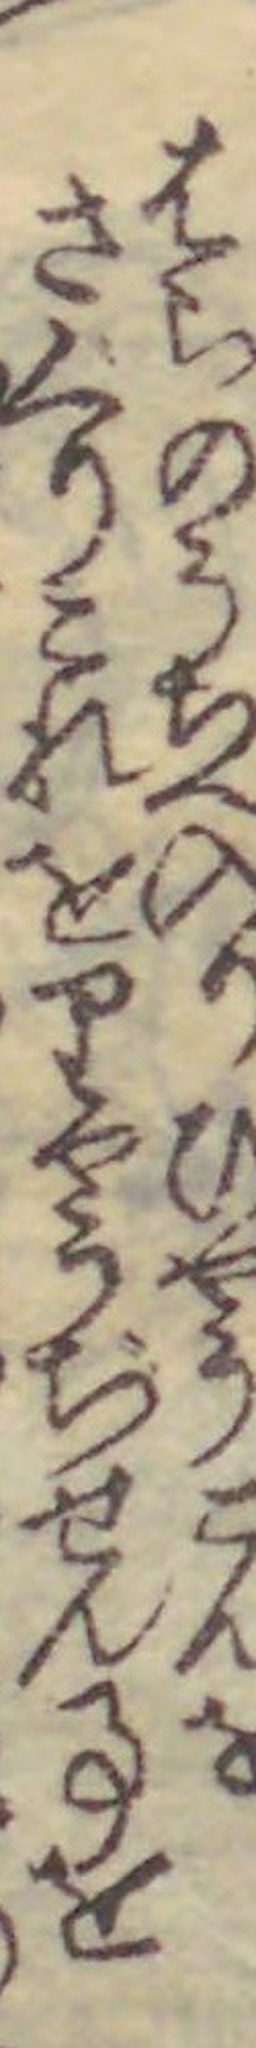さくりこれをりやうぢせん事を
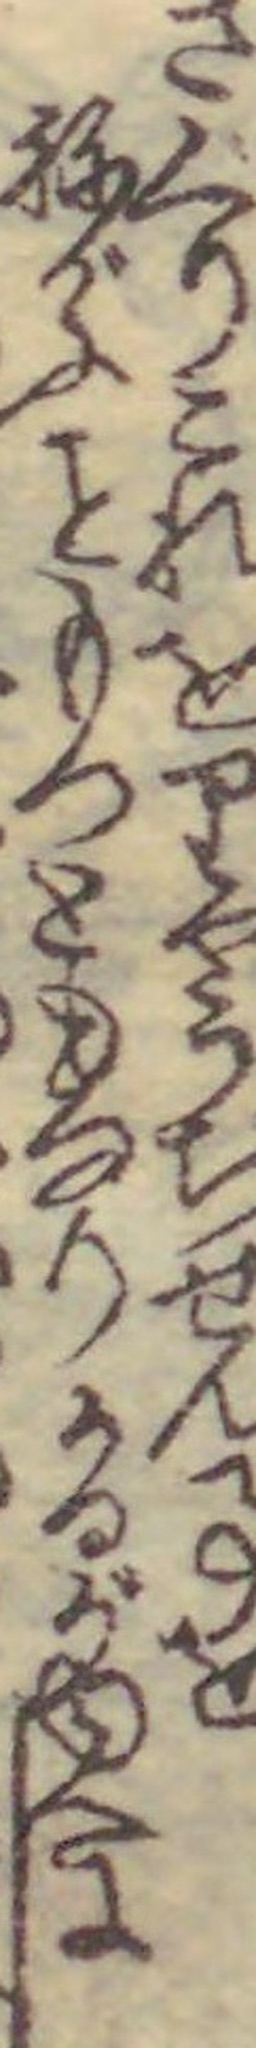ねがふこともつともなりかるがゆへに

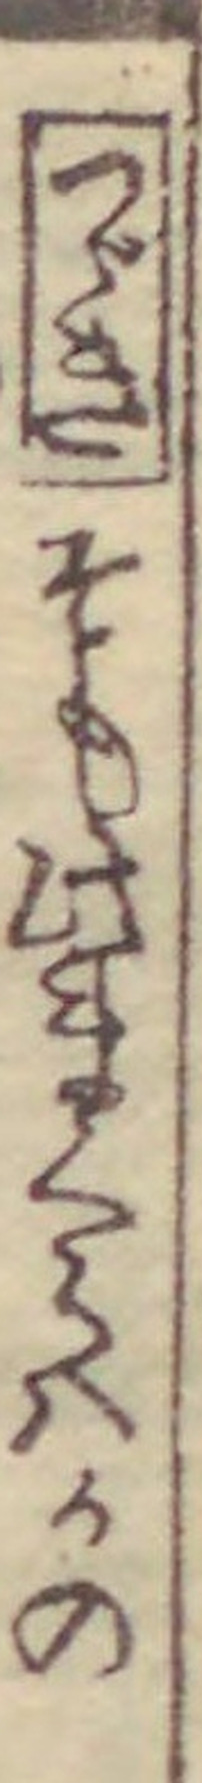[つゞき]そも此まくらはかの
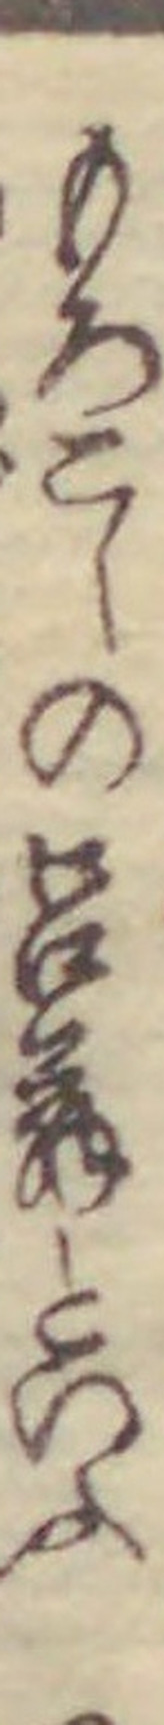もろこしの呂義といふ
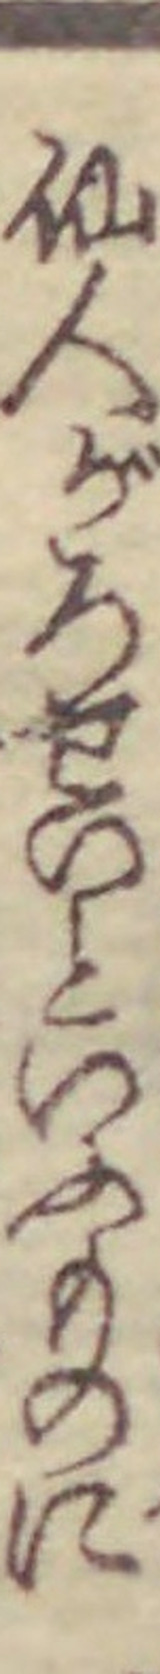仙人がろせいといふものに
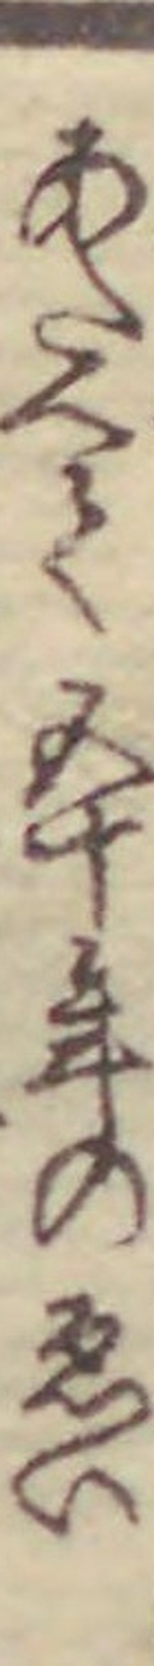あたへて五十年のゑい
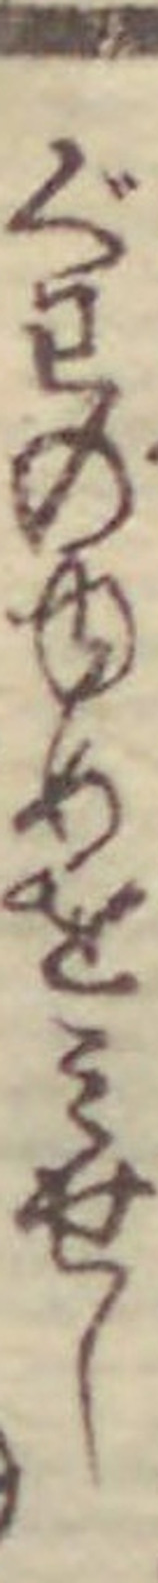ぐわのゆめをみせし
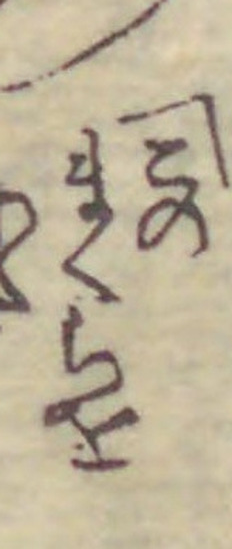まくらを
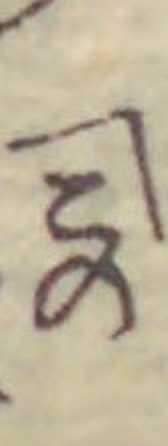〽この
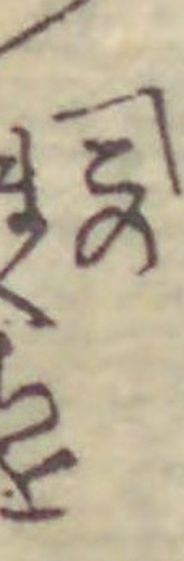〽この
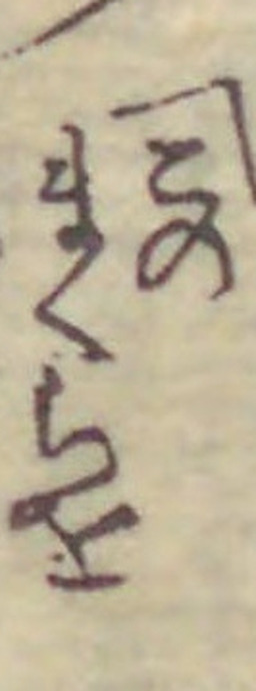まくらを
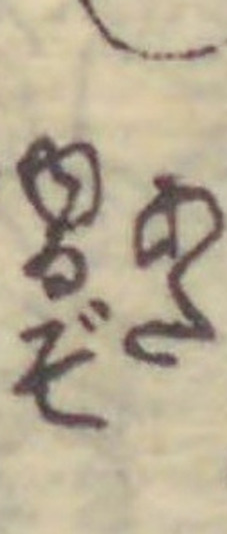ゆるぞ
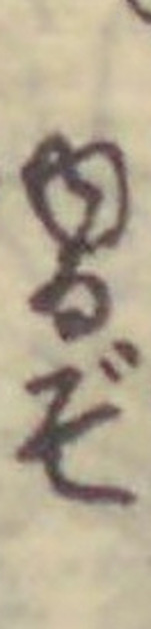ゆるぞ
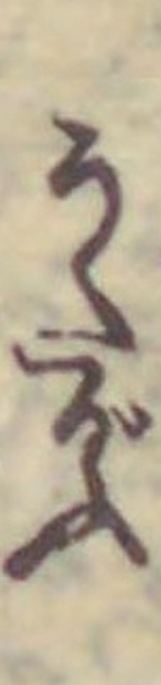うたがふ
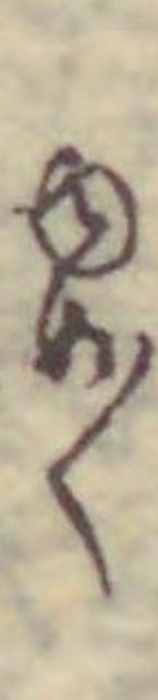ゆめ〳〵
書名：腹内窺機関 2巻
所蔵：国立国会図書館 National Diet Library, JAPAN
